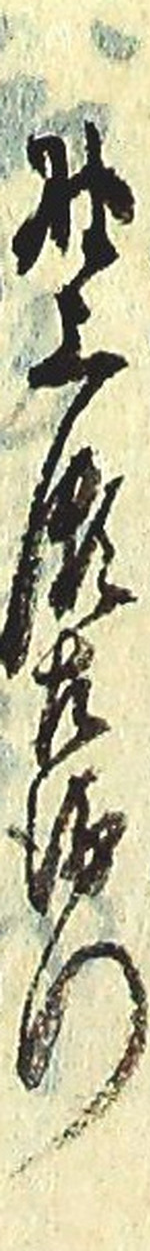野上瀬左衛門
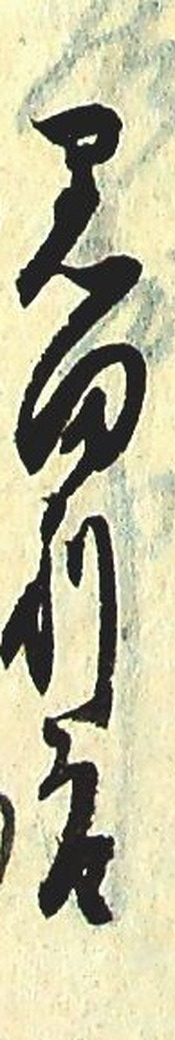黒田利吉
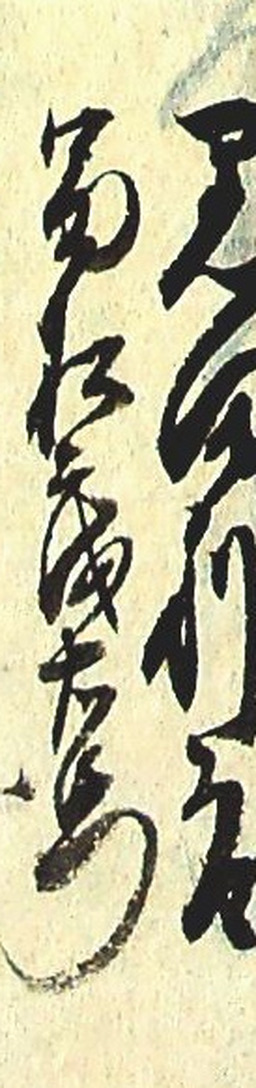冨松茂右衛門
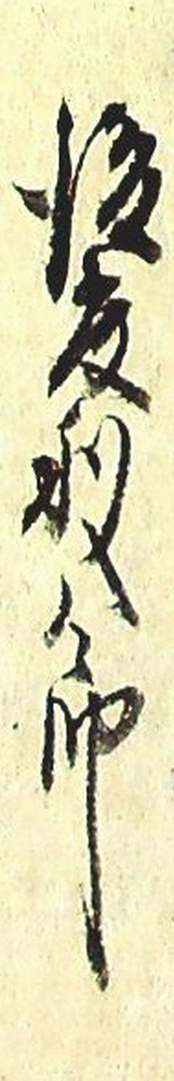後藤利八郎
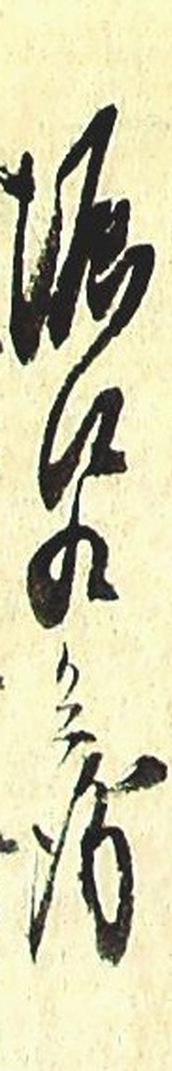堀江九兵衛
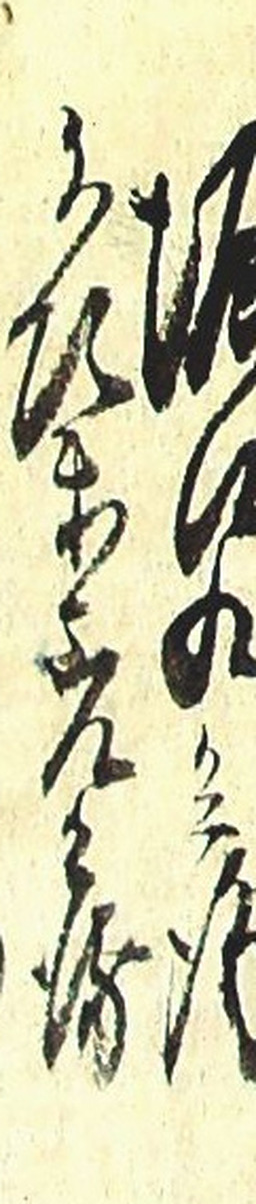久須米善兵衛
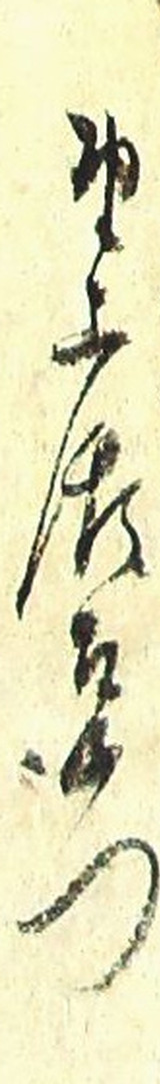野上瀬左衛門

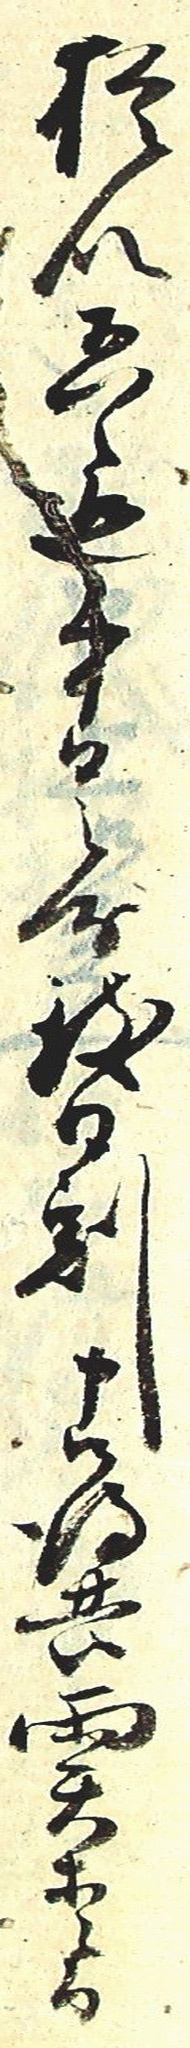猶以右之通三十日之分致日割申候得共雨天等にて
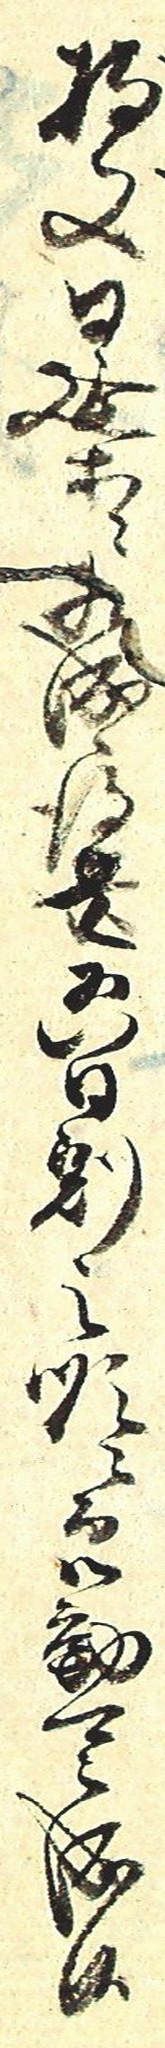指支日延等に相成候得は右日割之順にて御勤可被成候
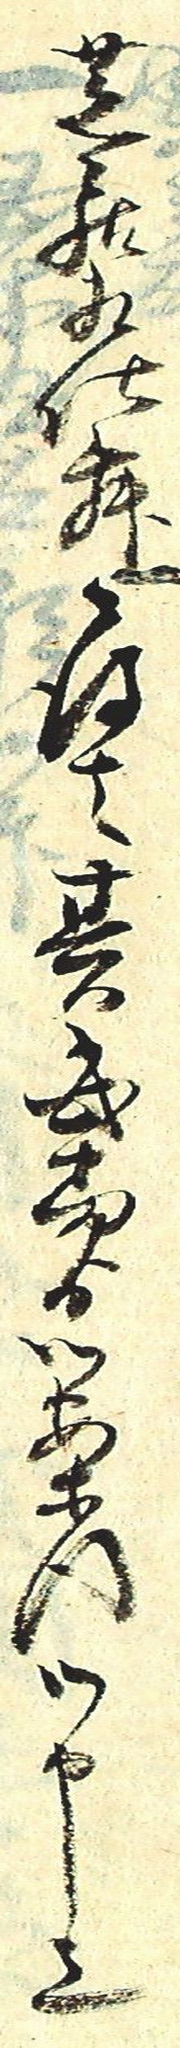芝居相仕舞候得は其日当番ゟ御案内御申上
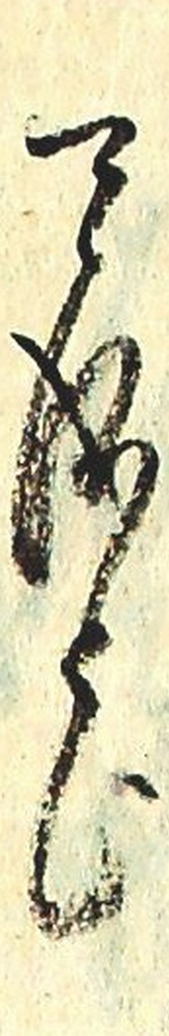可被成候以上
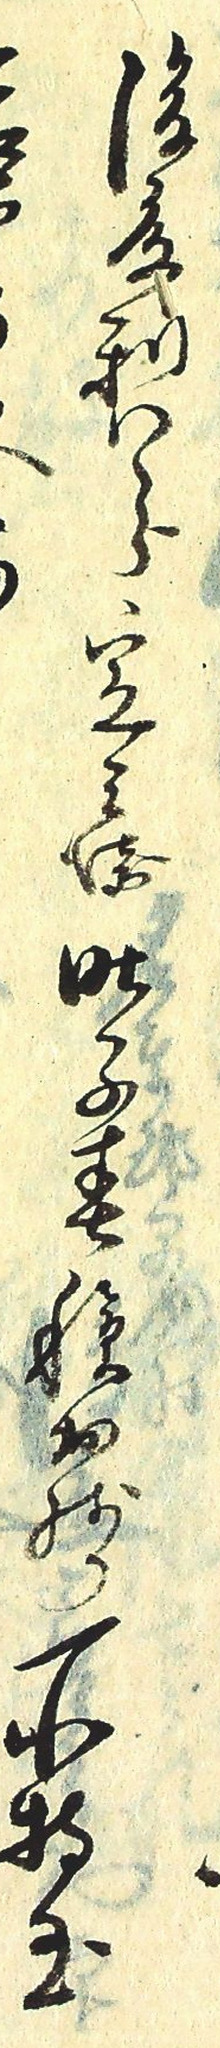後藤利八郎定兵衛昨子春積出残り所持玉
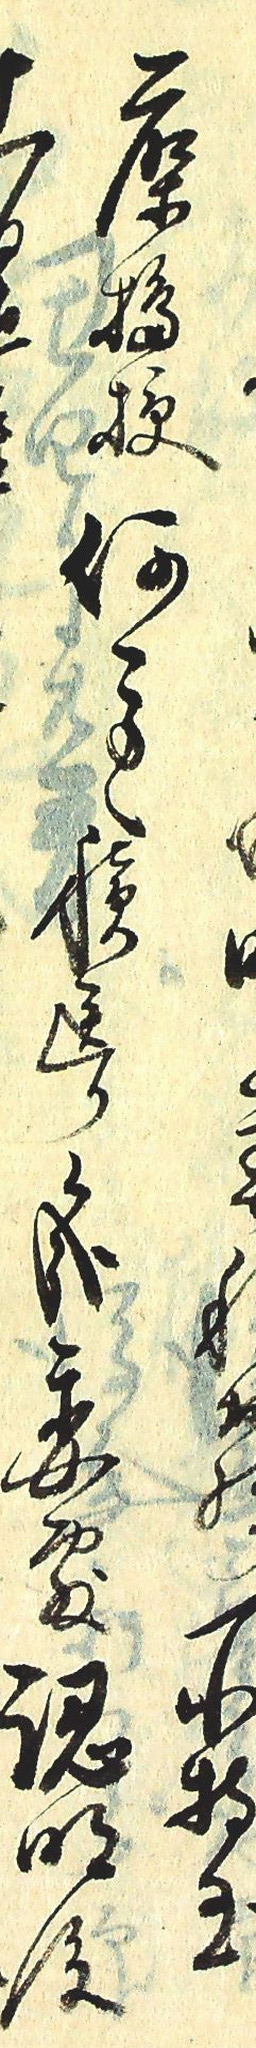蒅搗絞何方へ積送り候哉委敷認明後
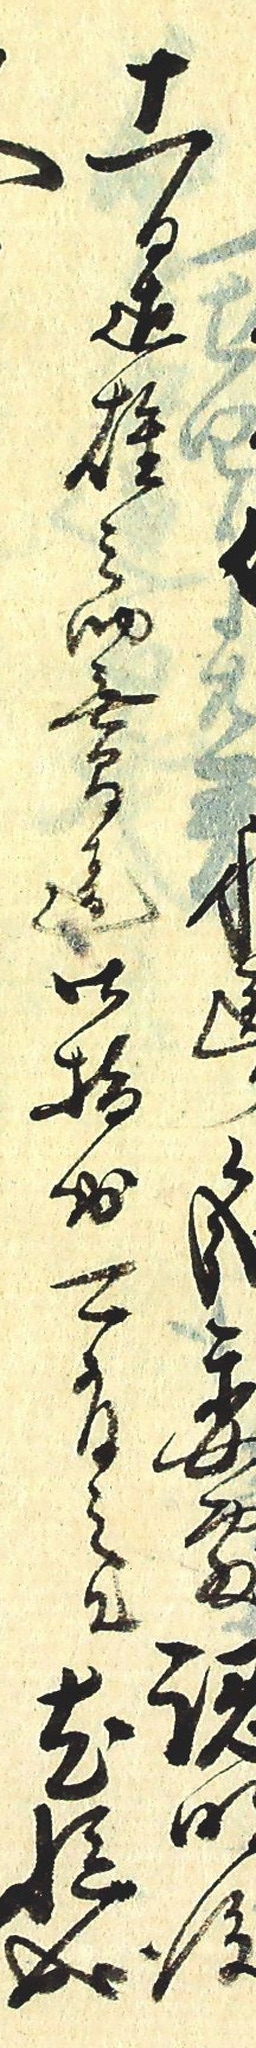十一日迄雄之助無間違御指出可有之候尤慥成
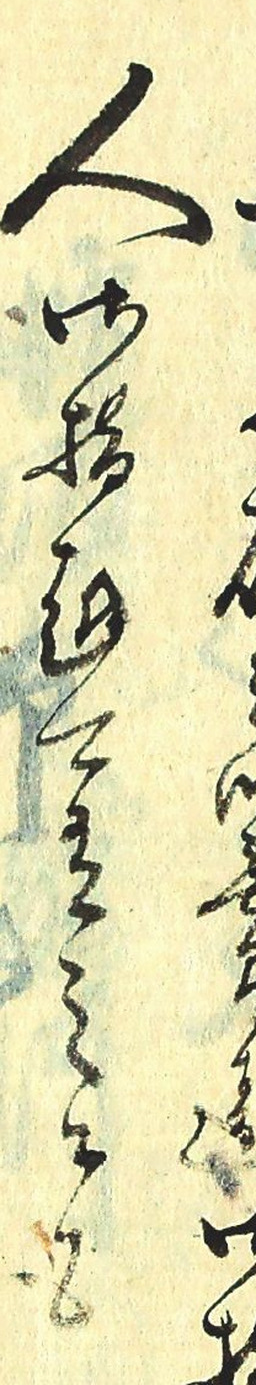人御指越可有之候以上
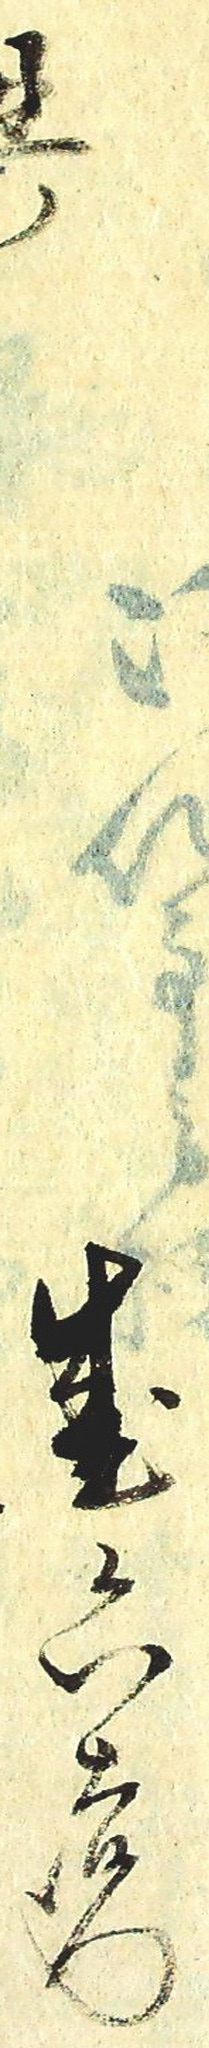丑盛六右衛門
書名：諸御願書控(弐番）
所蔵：鳴門教育大学 Naruto University of Education
